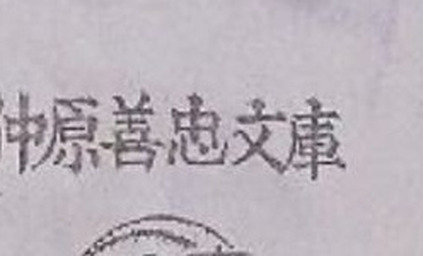「仲原善忠文庫
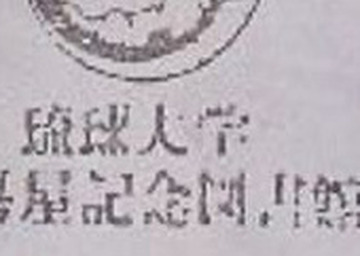琉球大学
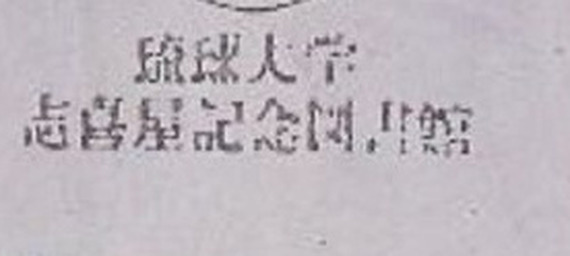志喜屋記念図書館」
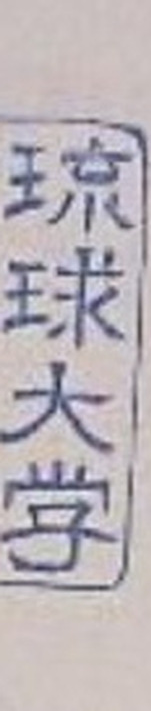琉球大学
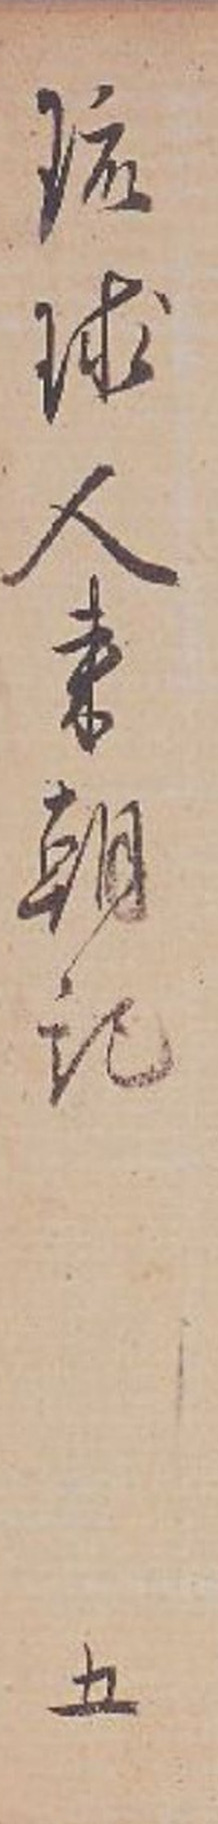利琉球人来朝記五

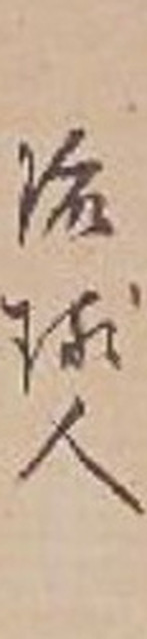琉球人
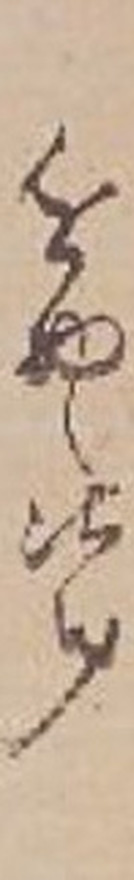進物之次第

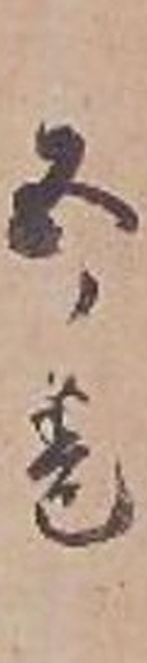五ノ巻
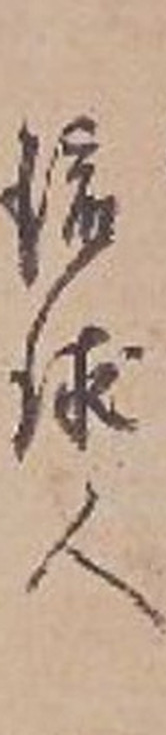琉球人
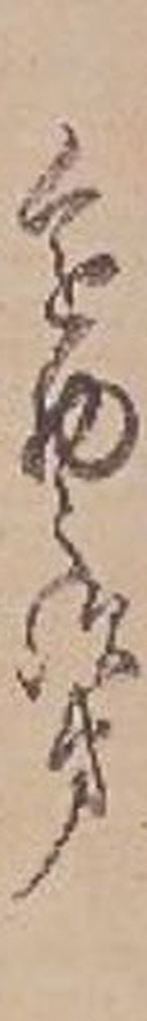進物之次第
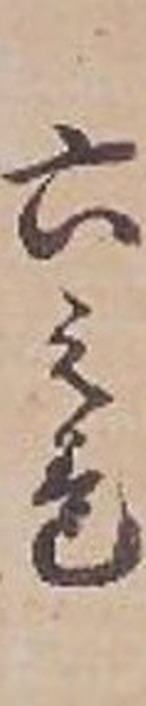六之巻
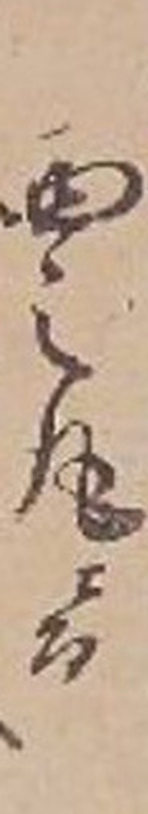西之丸に而
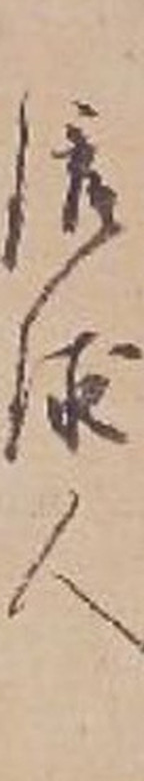琉球人
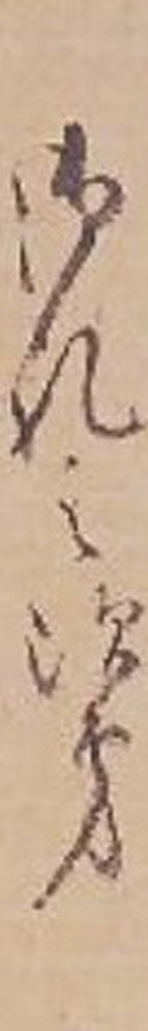御礼之次第
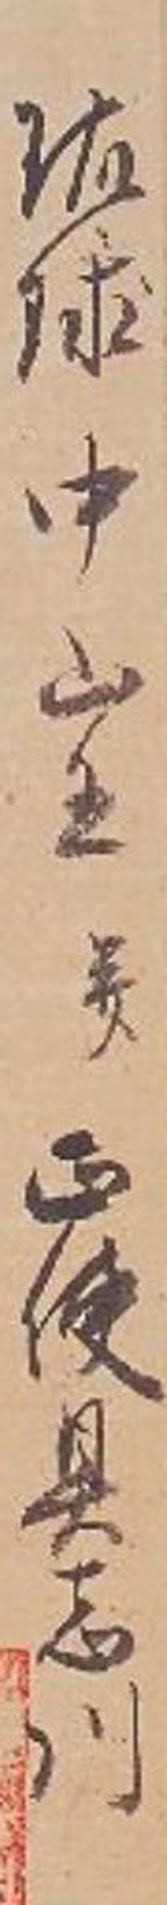琉球中山王幷正使具志川
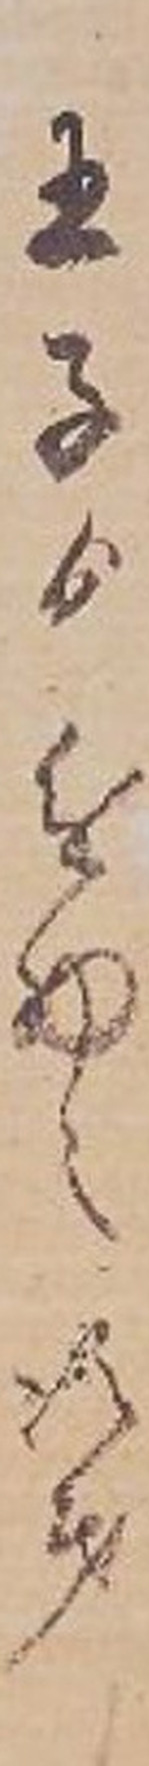王子ゟ進物之次第
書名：琉球人来朝記 五、六、七
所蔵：University of the Ryukyus Library
